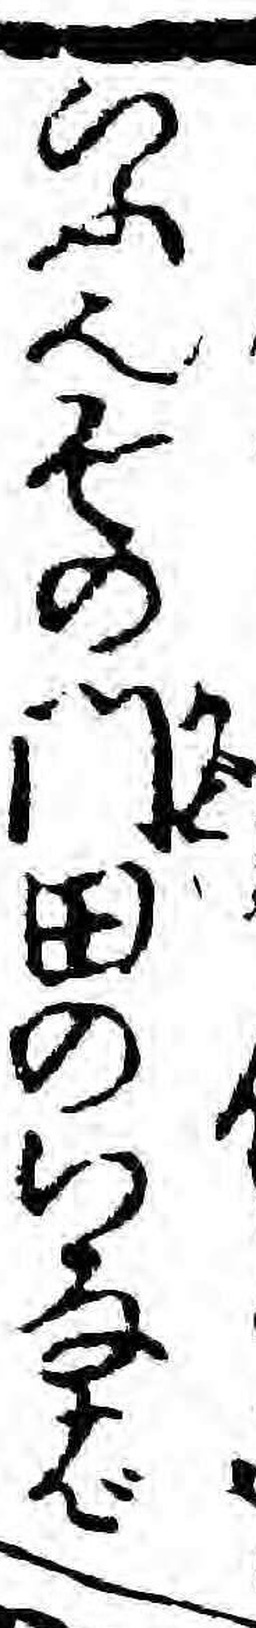いふ也その門田のいなば
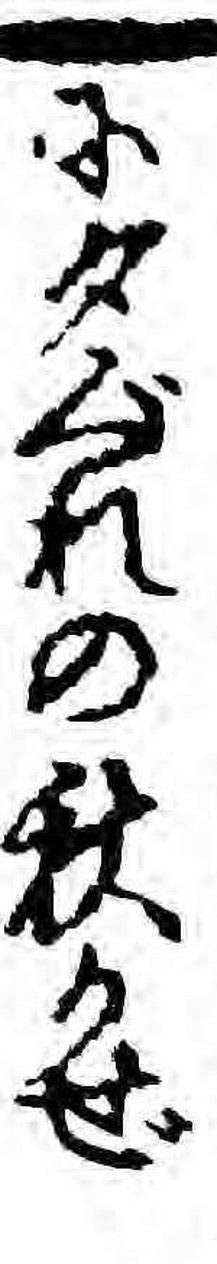に夕ぐれの秋かぜ
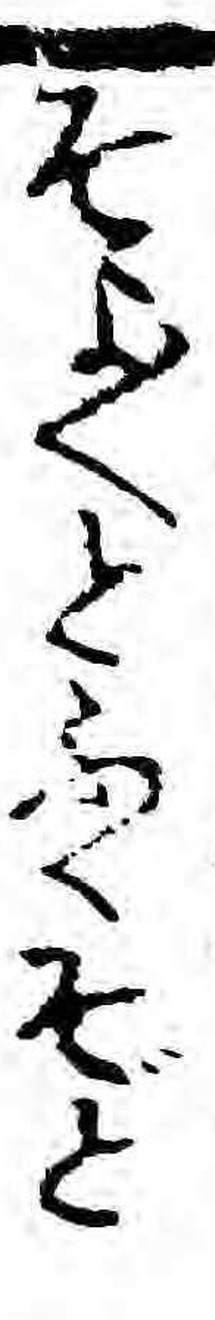そよ〳〵とふくぞと
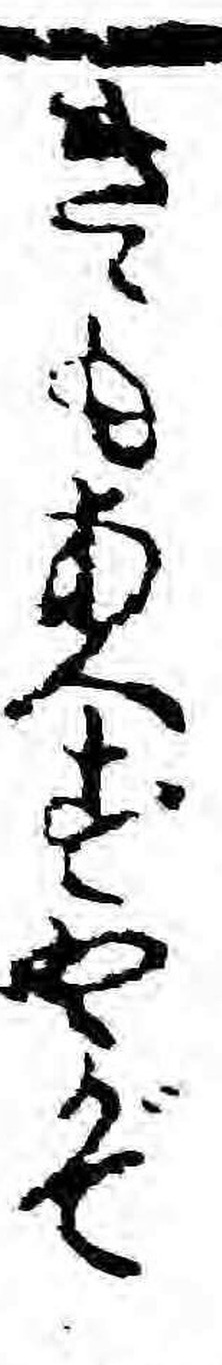きゝもあへずやがて
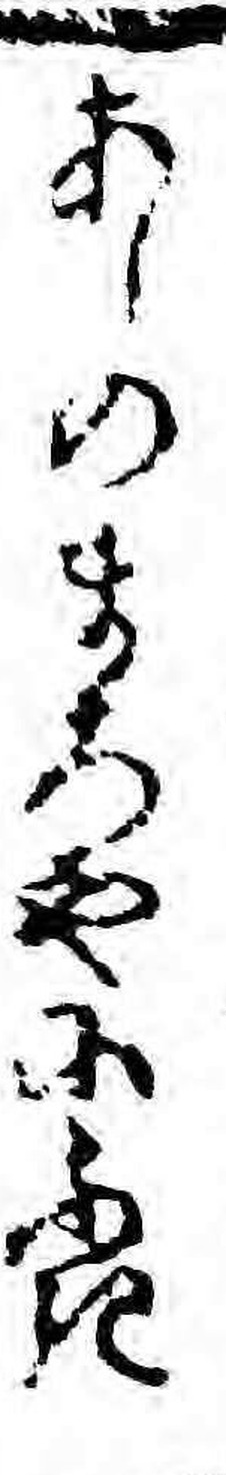あしのまろやにふき
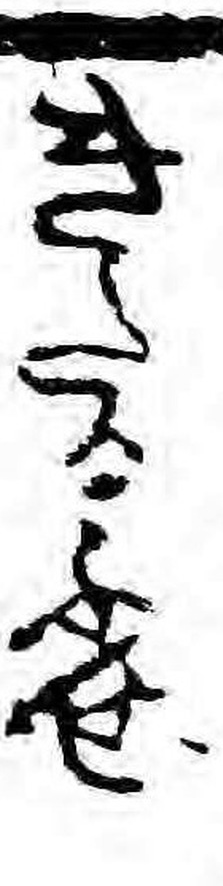きたるふぜ
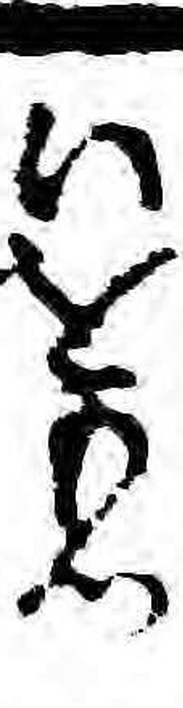いをもつ
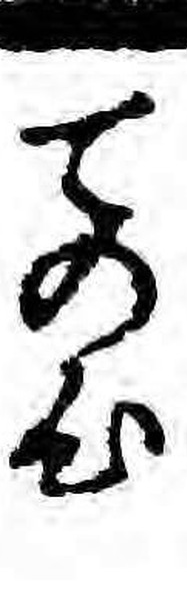ての心
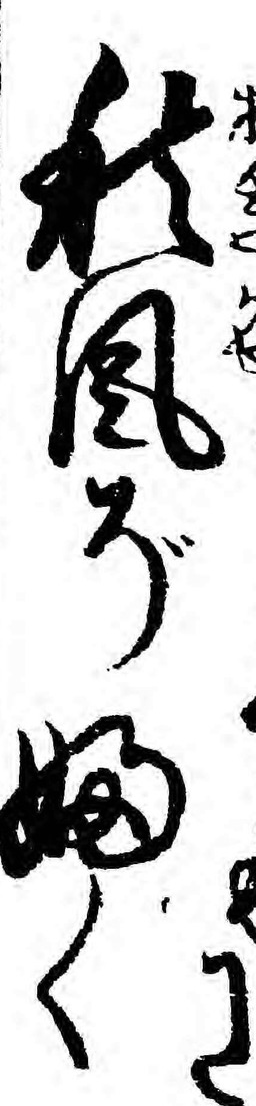秋風ぞふく

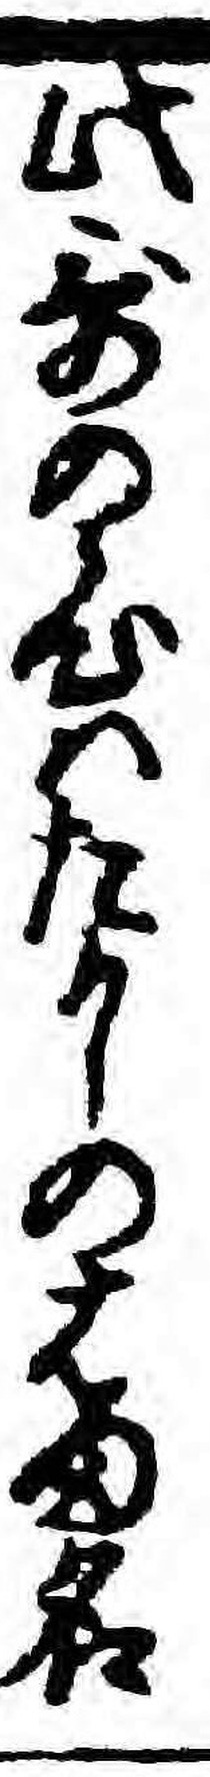此哥の心はたかしのはま名
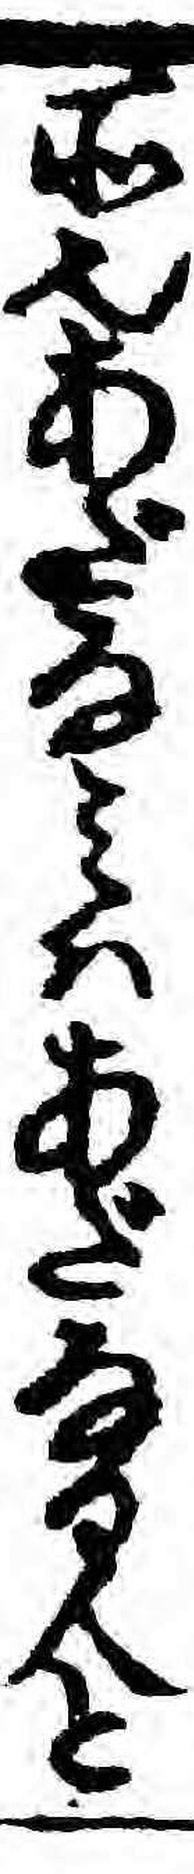所也あだなみはあだなる人と
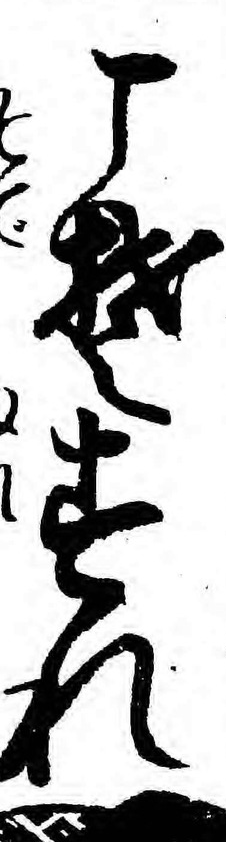こそすれ
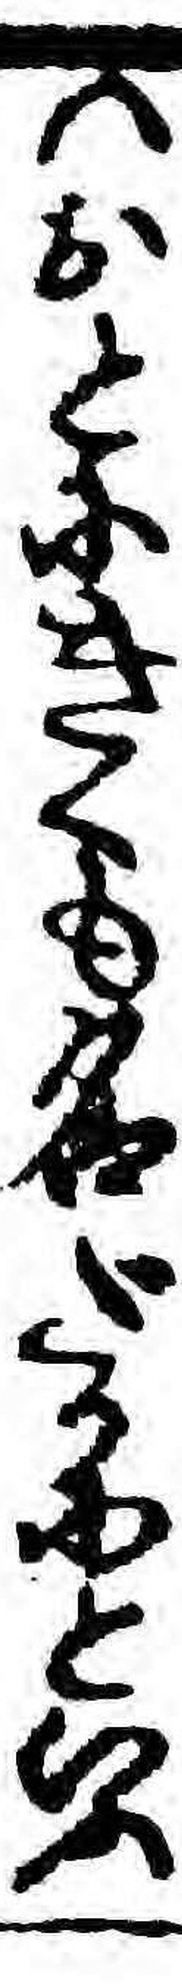はおとにきくも名だかにといふ
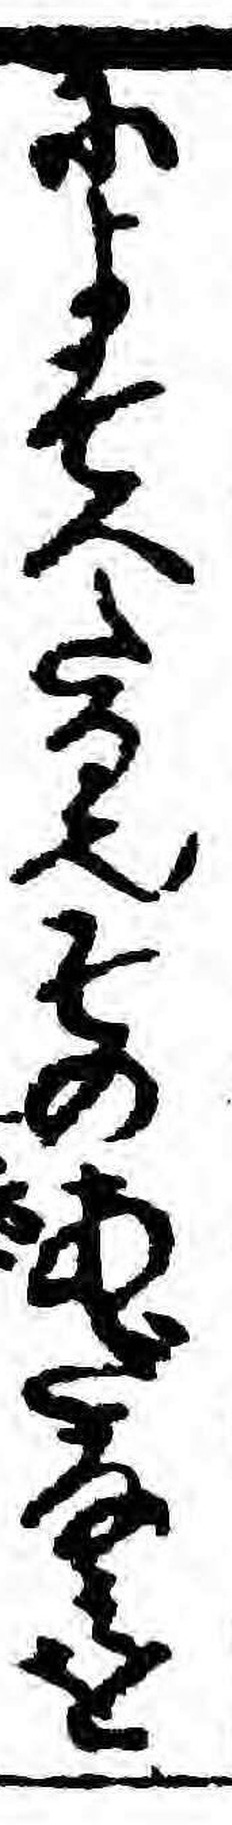によそへたる也そのあだなみを
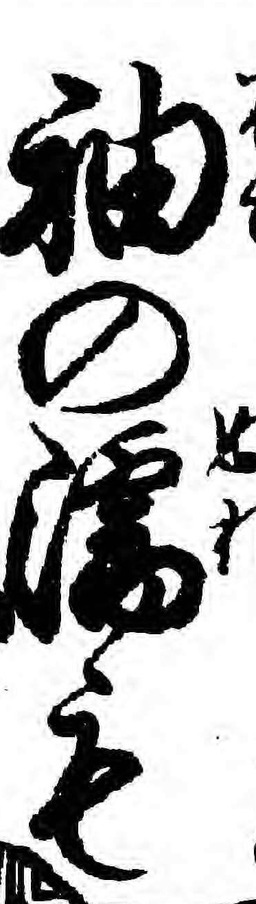袖の濡も
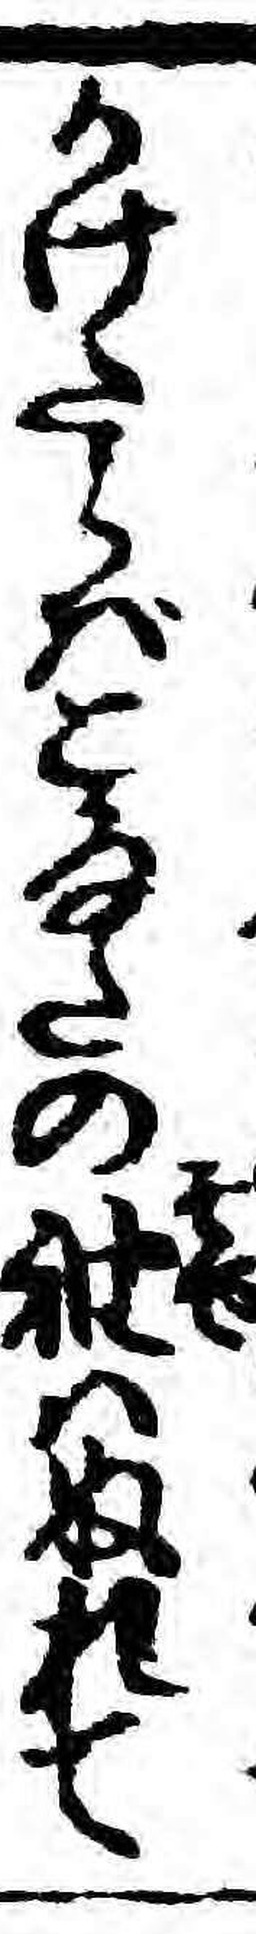かけたらばこなたの袖はぬれて
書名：頭書和歌注譯／壽賀多百人一首小倉錦
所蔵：国文学研究資料館
